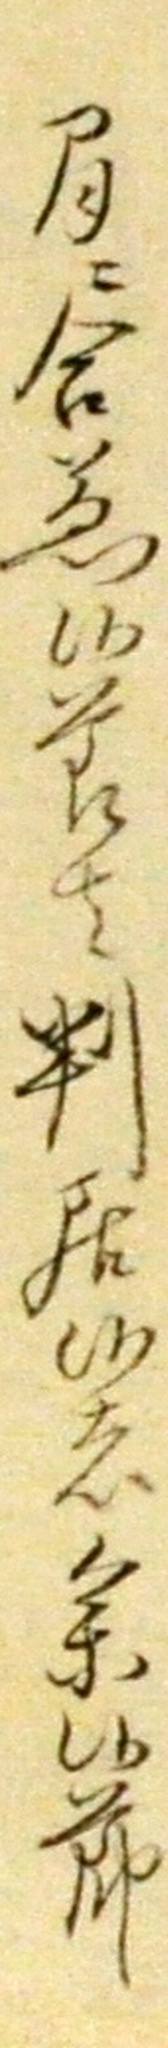間ニ合兼候節者判居候者参候節
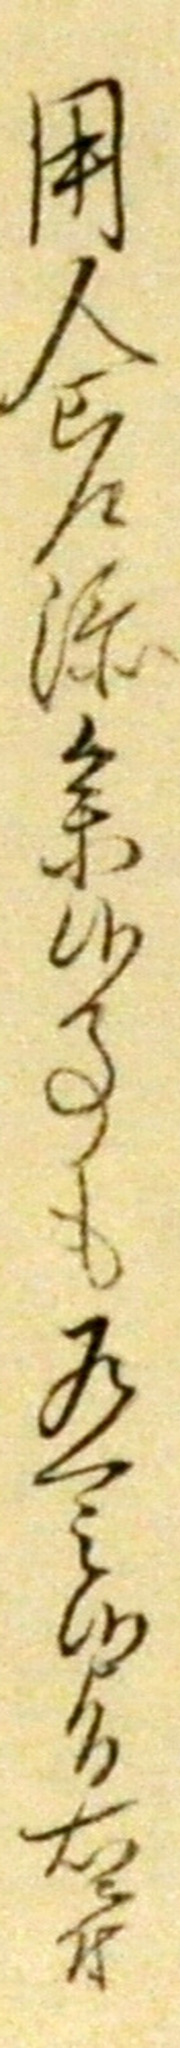用人差添参候事も有之候旨右ニ付
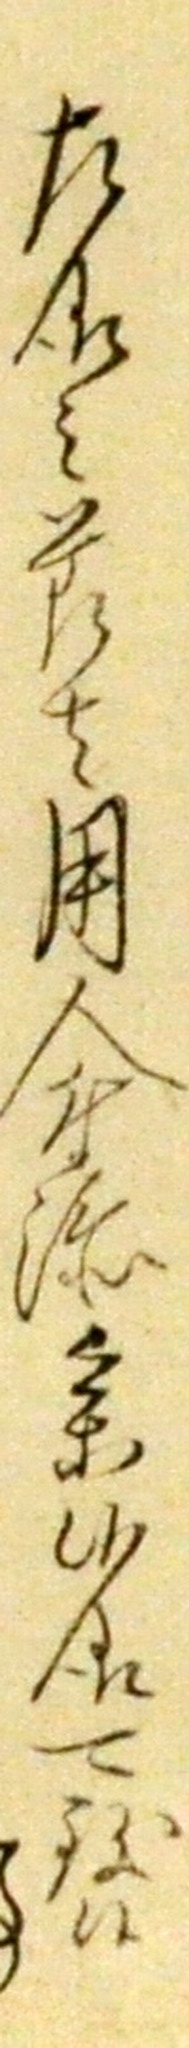左様之節者用人付添参候様可致候事
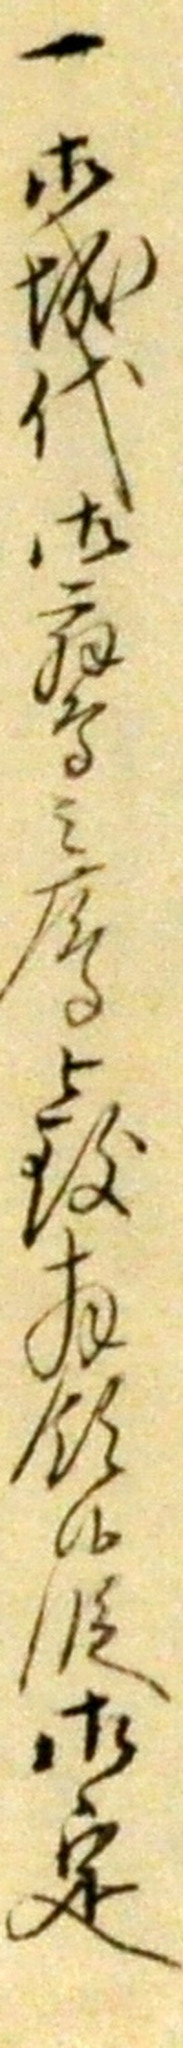一御城代御鷹之雁被致拝領候段御定
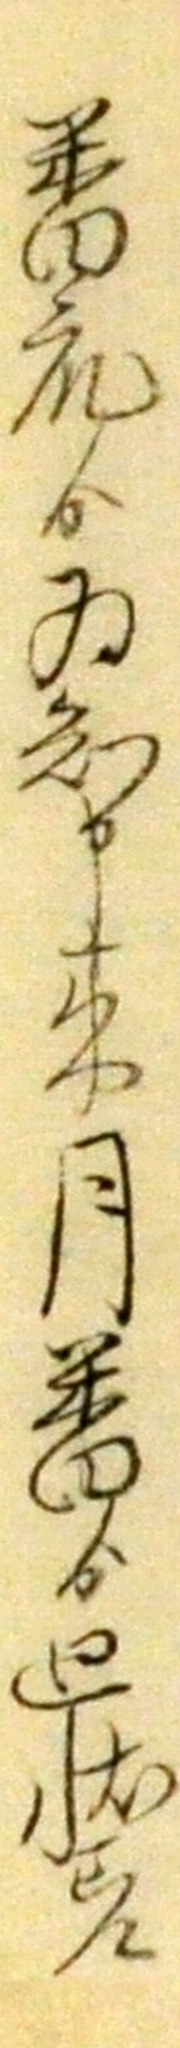番衆ゟ為知申来月番ゟ廻状差
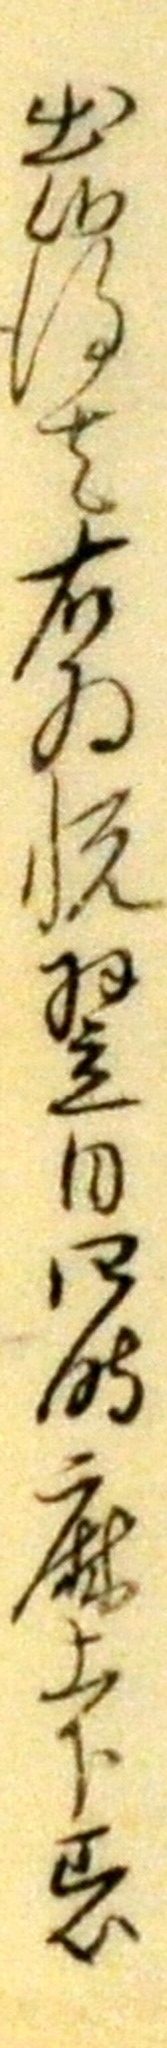出候得者右為悦翌日四時麻上下着
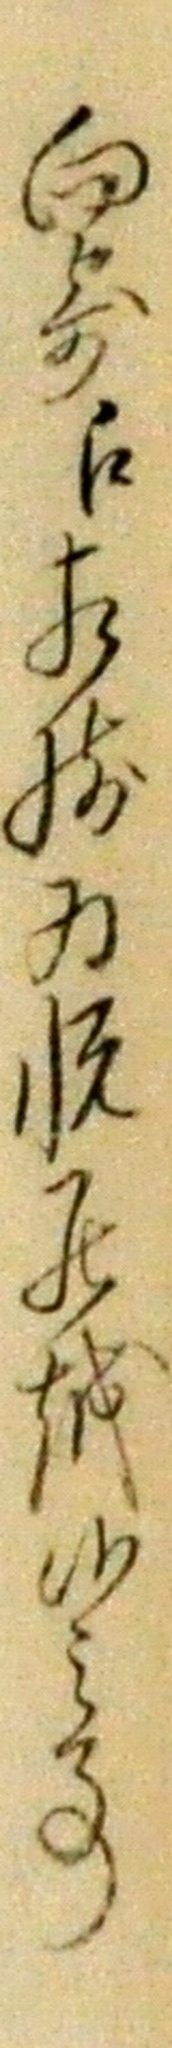向寄え相揃為悦罷越候之事
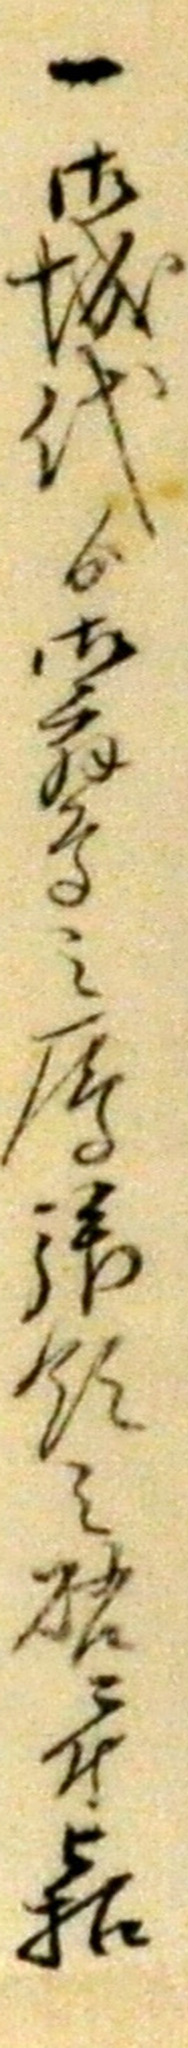一御城代ゟ御鷹之雁拝領之賄ニ付被招
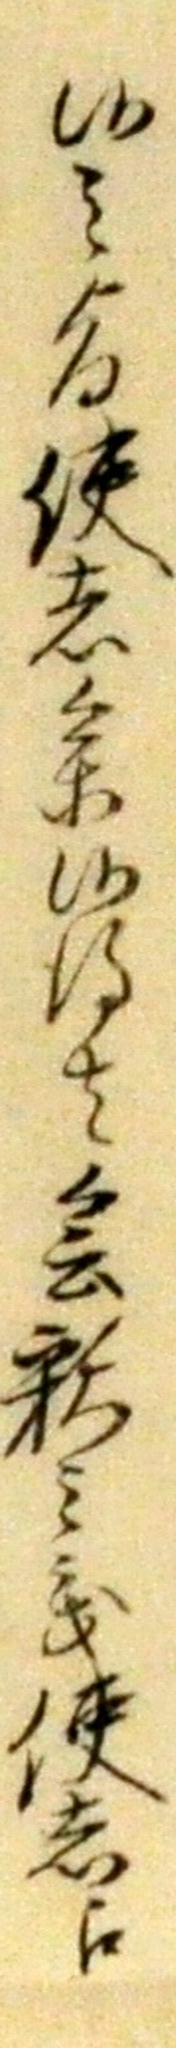候之旨使者参候得者会釈之義使者え
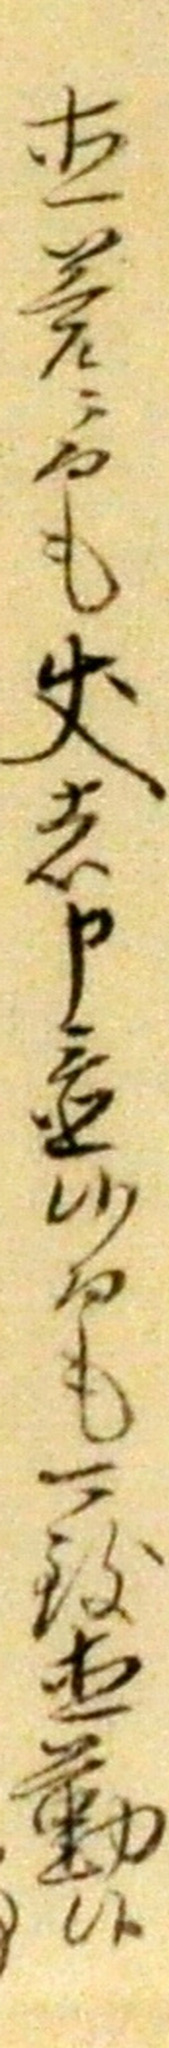直答ニ而も使者申置候而も可致直勤候事
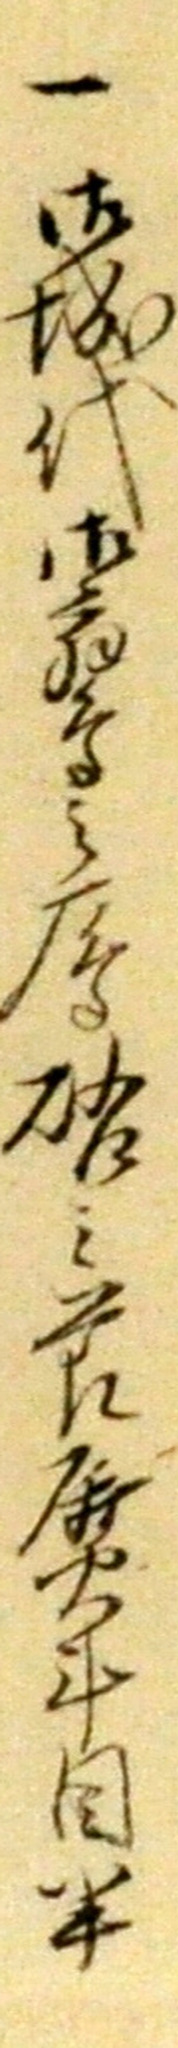一御城代御鷹之雁賄之節熨斗目半
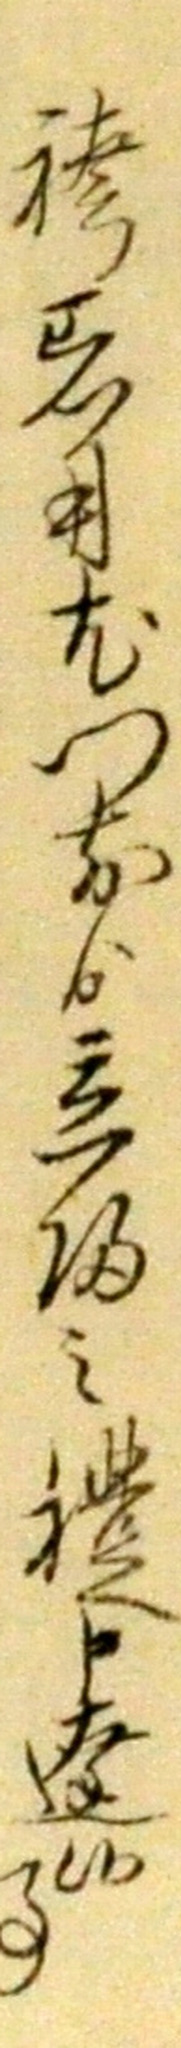袴着用尤門前ゟ立帰之礼申達候事
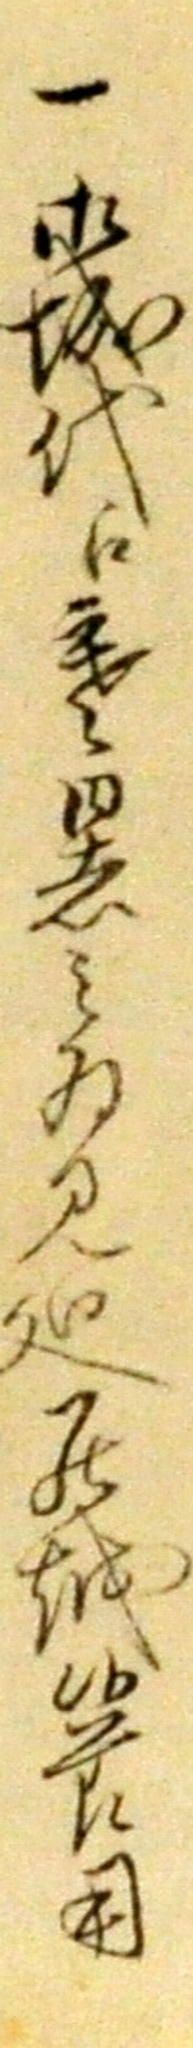一御城代え寒暑之為見廻罷越候節用
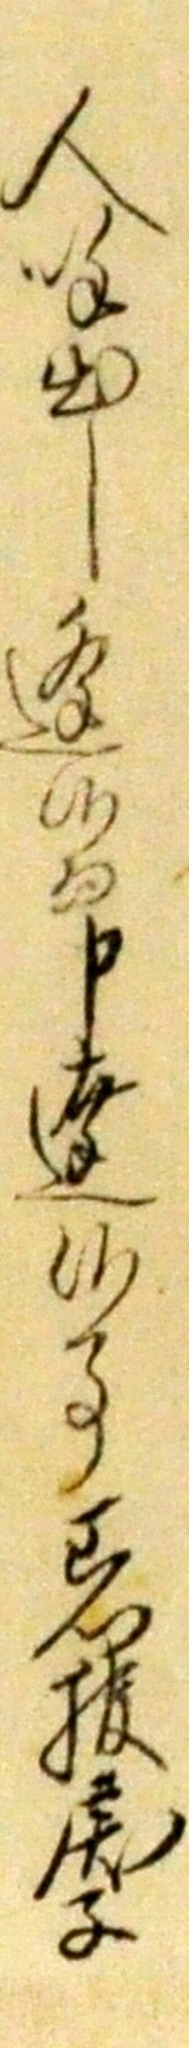人呼出し逢候而申達候事着服戻子
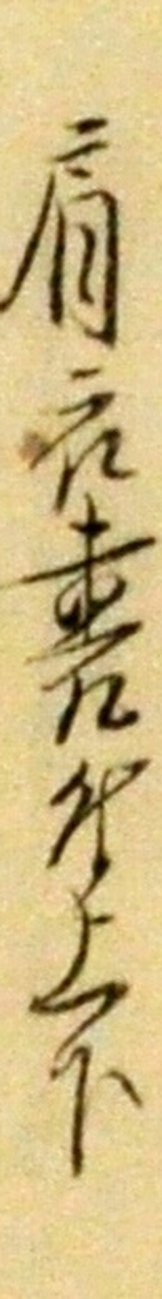肩衣裏付上下
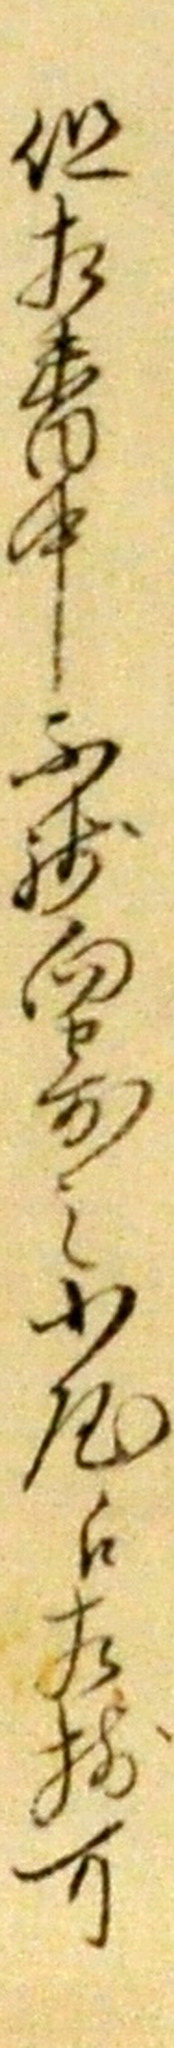但相番中不残向寄之小屋え相揃可
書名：大阪加番関係諸書留〔一括〕
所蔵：伊那市立高遠町図書館・合同会社AMANE
